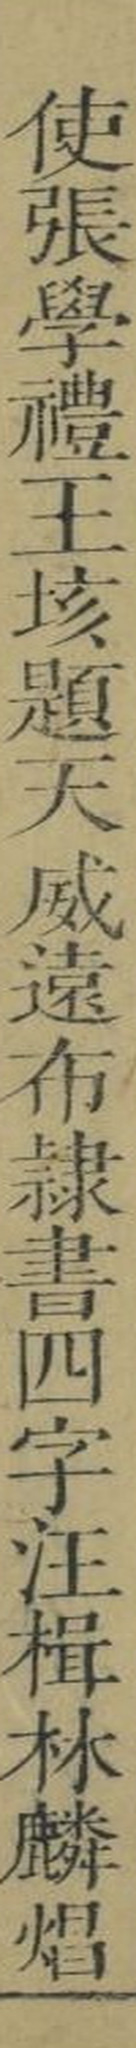使張學禮王垓題天威遠布隷書四字汪楫林麟焻
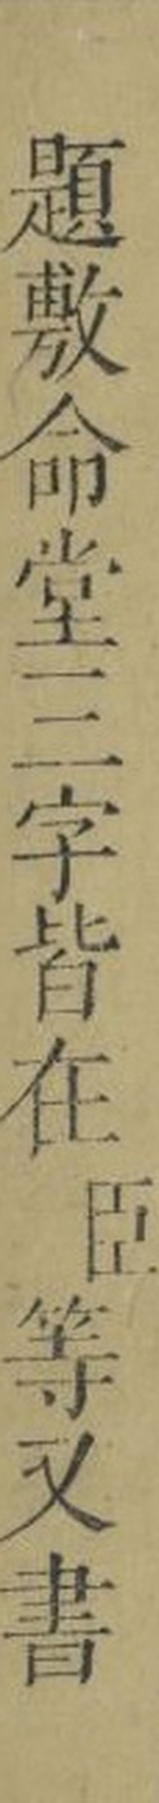題敷命堂三字皆在臣等又書

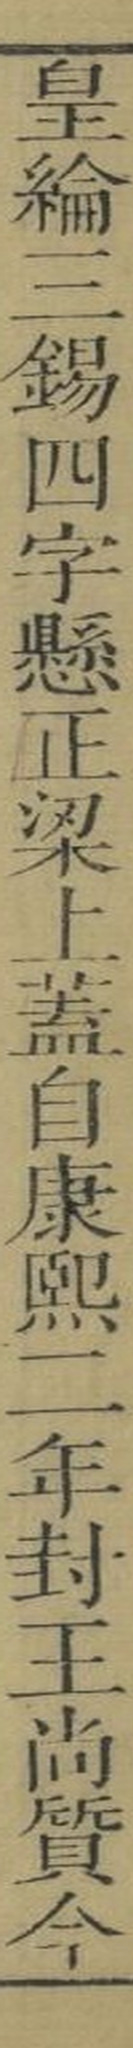皇綸三錫四字懸正梁上蓋自康煕二年封王尚質今
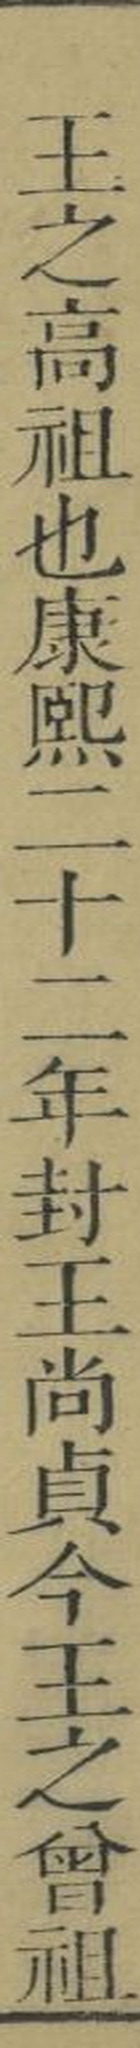王之高祖也康煕二十二年封王尚貞今王之曾祖
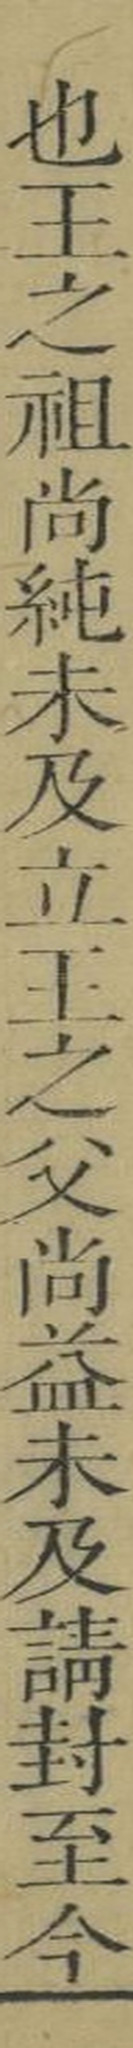也王之祖尚純未及立王之父尚益未及請封至今
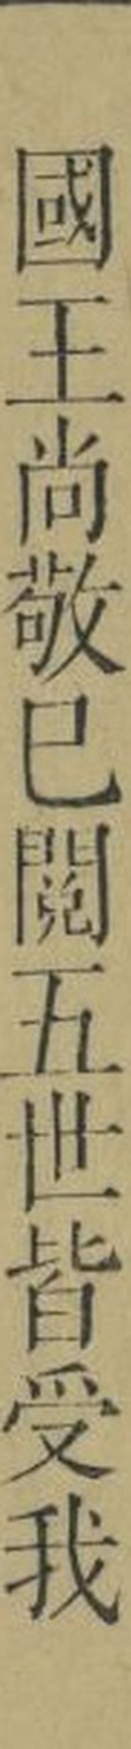國王尚敬巳閲五世皆受我
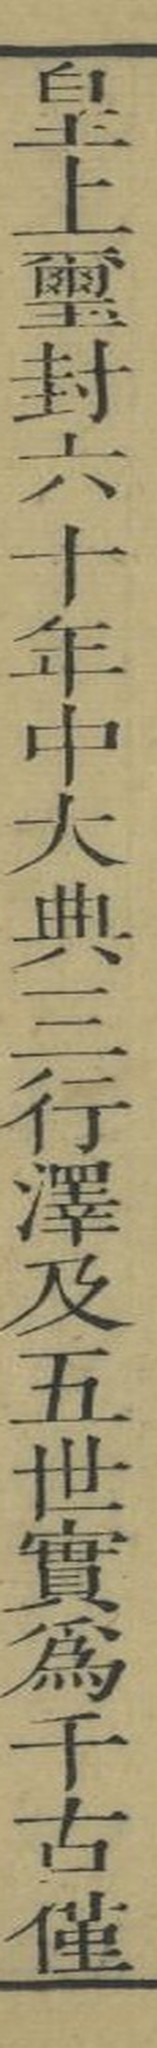皇上璽封六十年中大典三行澤及五世實爲千古僅
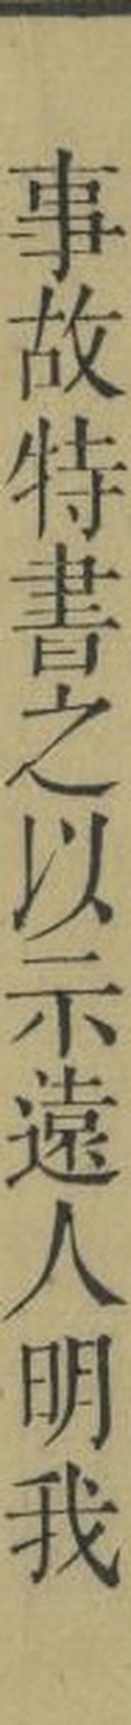事故特書之以示遠人明我
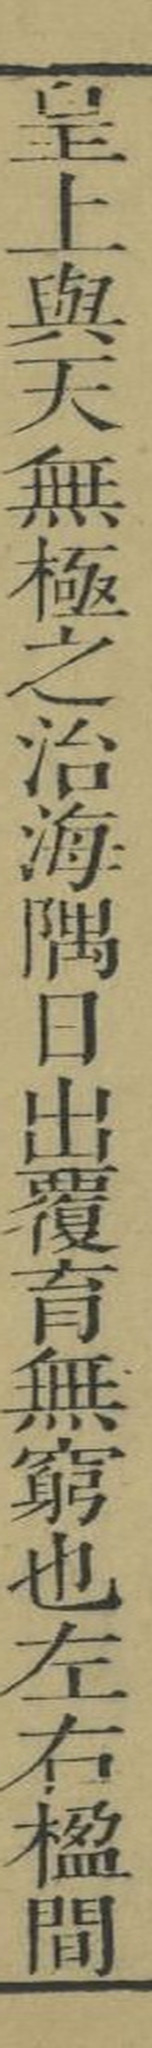皇上與天無極之治海隅日出覆育無窮也左右楹間
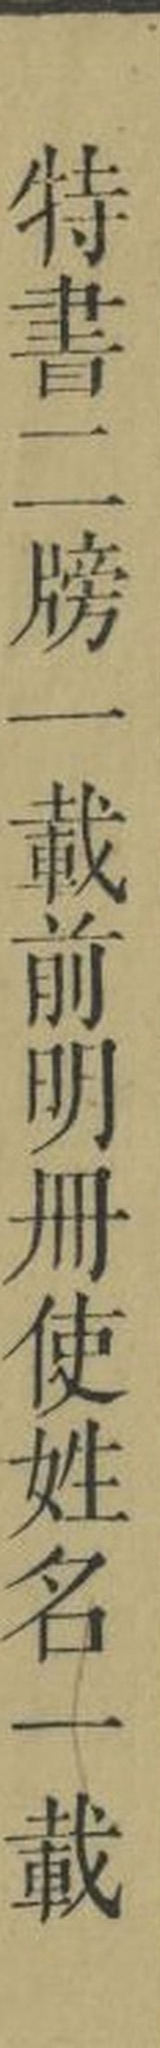特書二牓一載前明冊使姓名一載
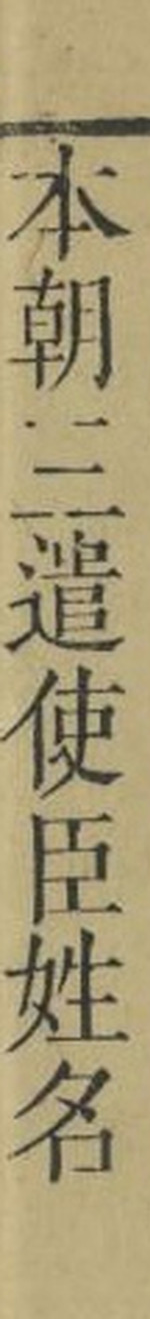本朝三遣使臣姓名
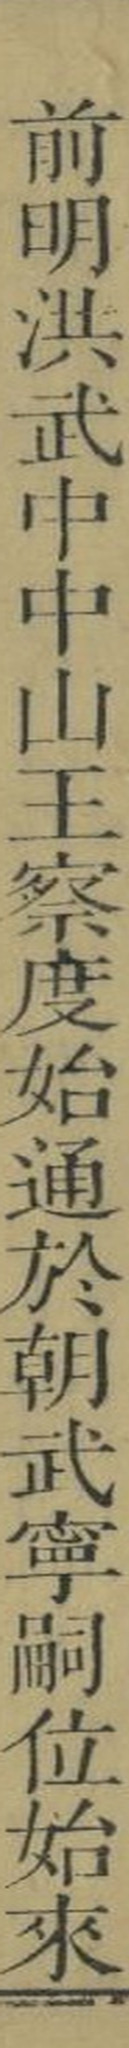前明洪武中中山王察度始通於朝武寧嗣位始來
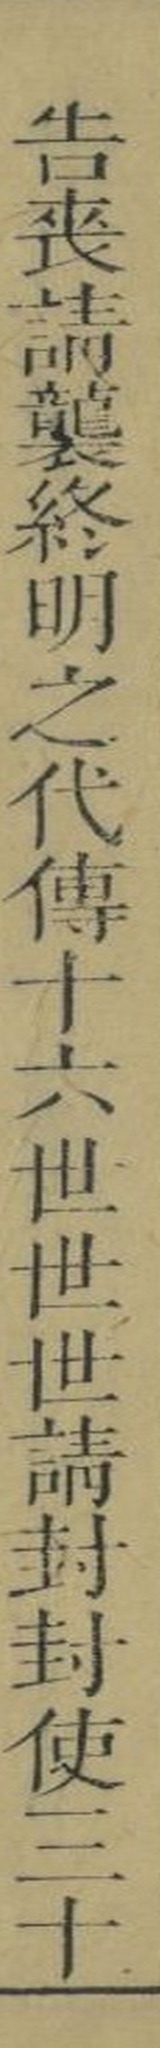告䘮請襲終明之代傳十六世世世請封封使三十
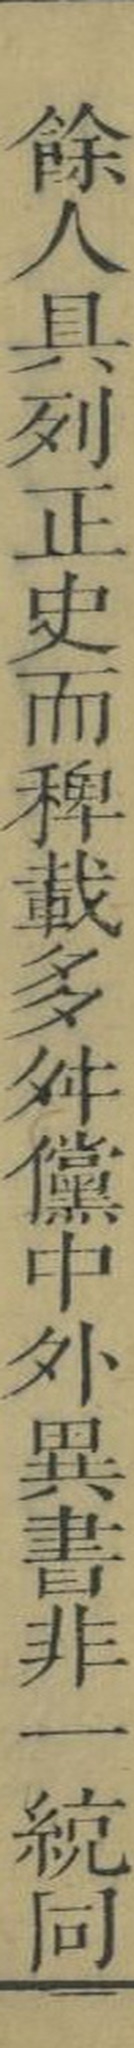餘人具列正史而稗載多舛儻中外異書非一綂同
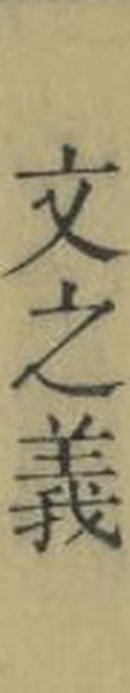文之義
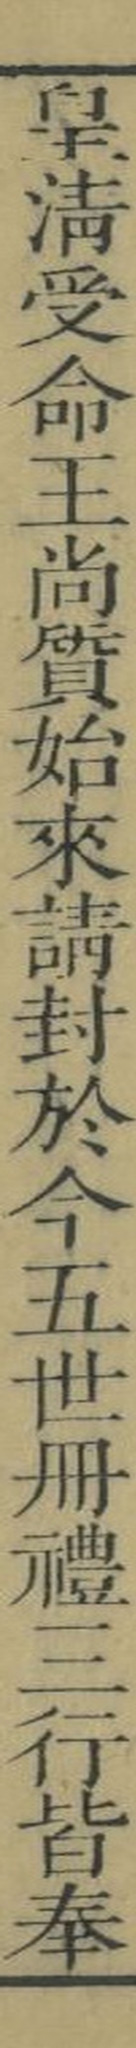皇淸受命王尚質始來請封於今五世冊禮三行皆奉
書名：中山伝信録 巻二
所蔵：University of the Ryukyus Library
